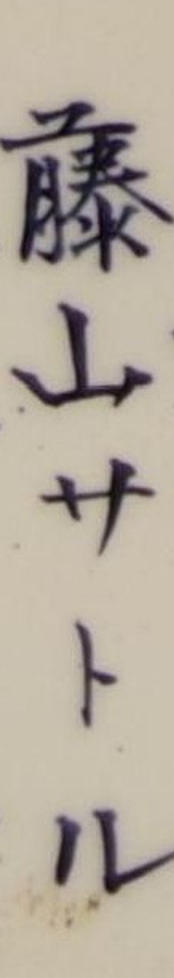藤山サトル
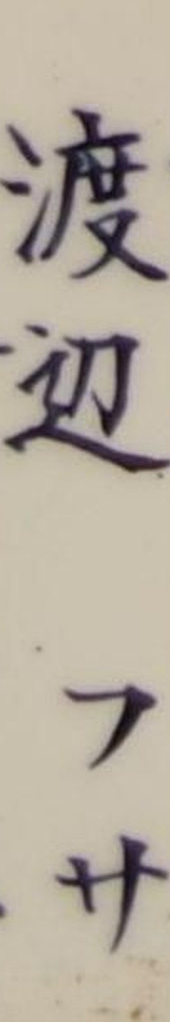渡辺フサ
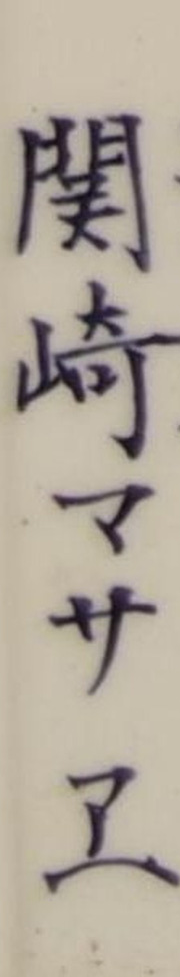関崎マサヱ

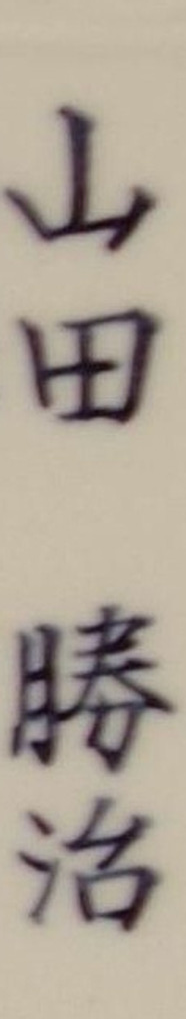山田勝治
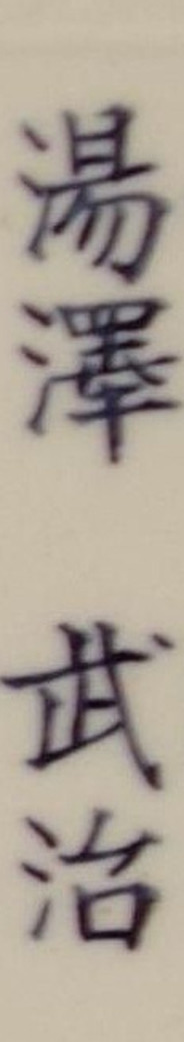湯澤武治
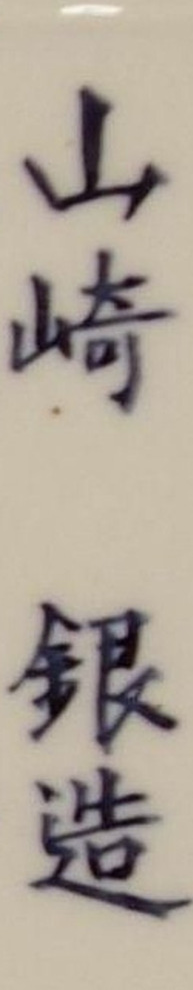山崎銀造
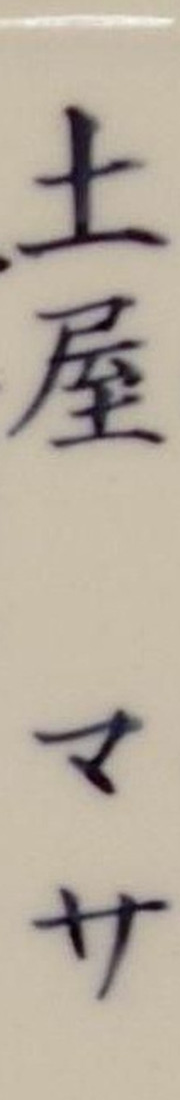土屋マサ
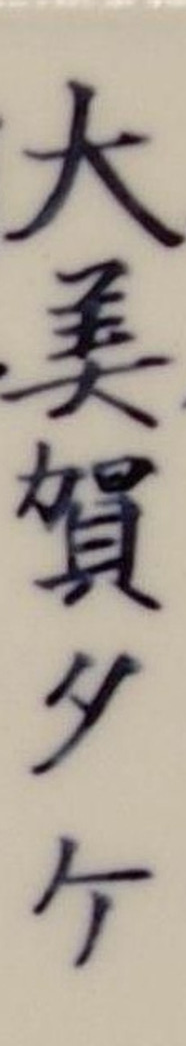大美賀タケ
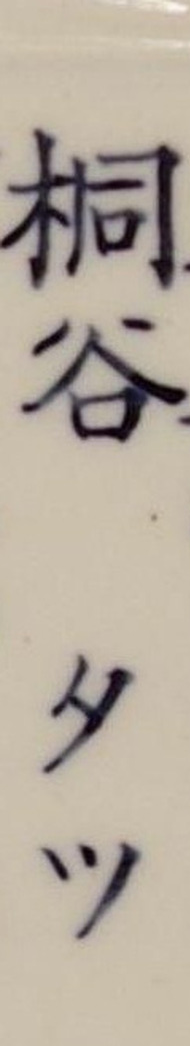桐谷タツ
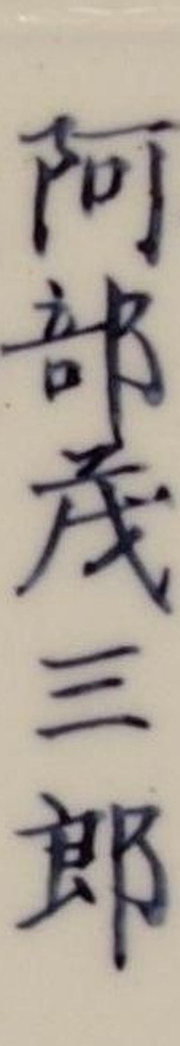阿部茂三郎
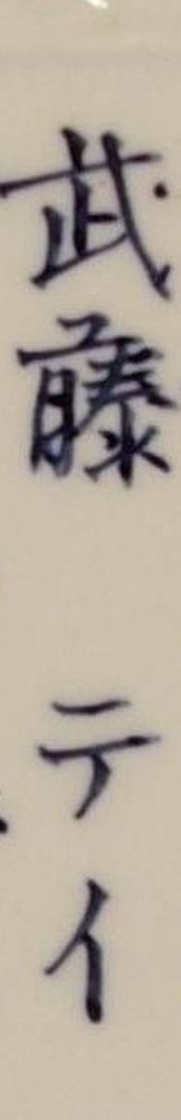武藤テイ
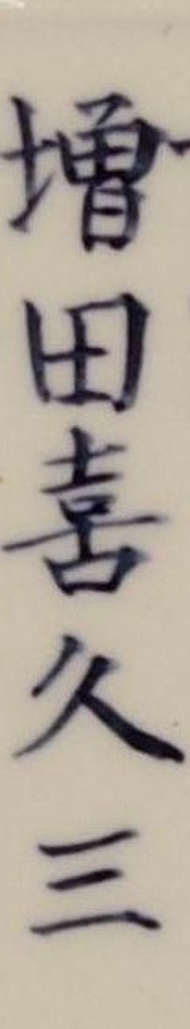増田喜久三
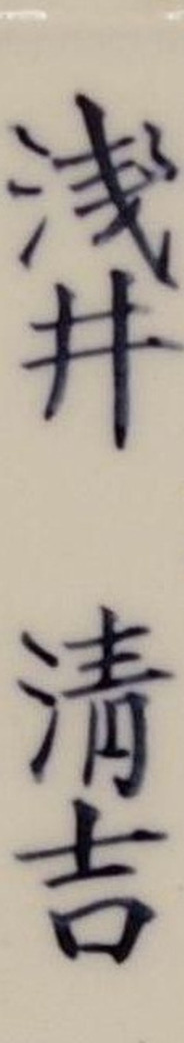浅井清吉
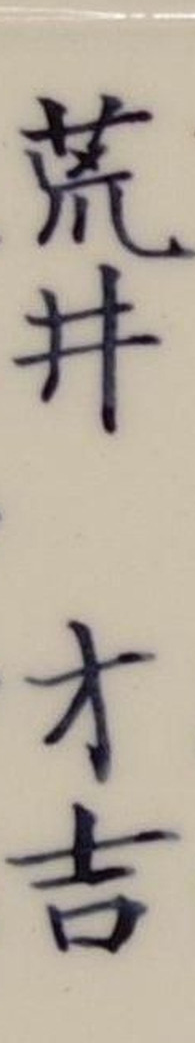荒井才吉
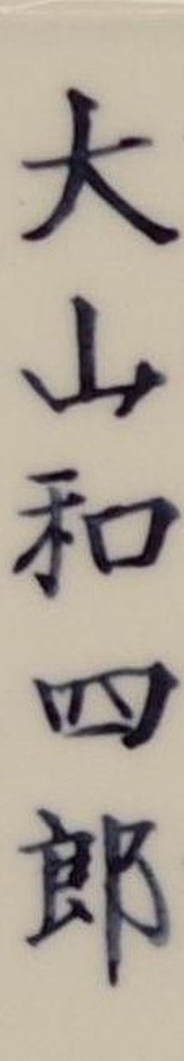大山和四郎
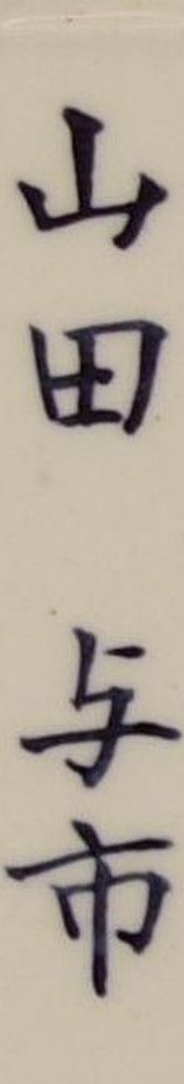山田与市
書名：E~L
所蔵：高野山金剛峯寺
